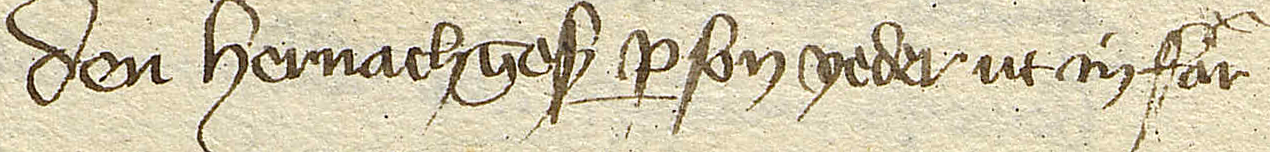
den hernachgeſ* p*ſon yeder ut in for*
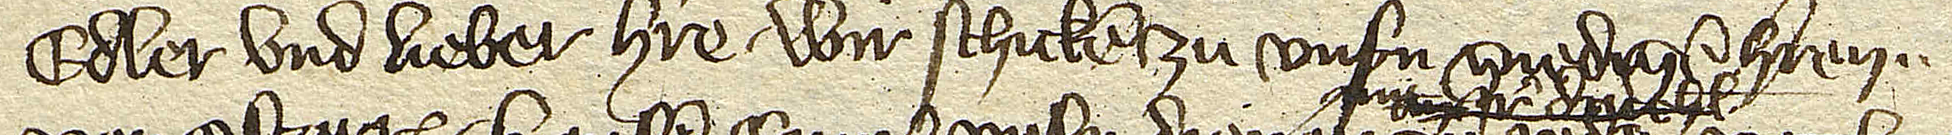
Edler vnd lieber h*re / wir ſchicke* cʒu vnſ*n gnedige* h*ren ~
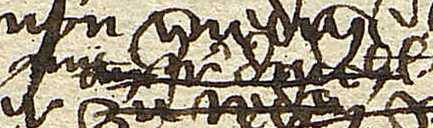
mit Ir* durchl*
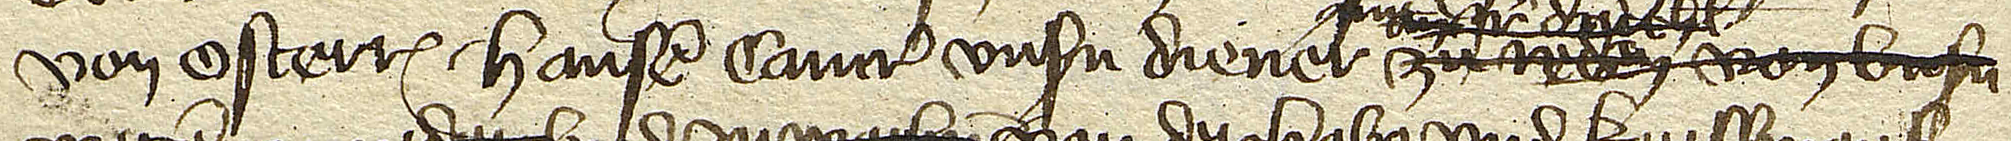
von Oſterr* / hanſe* Camr* vnſ*n diener cʒu reden von vnſ*n
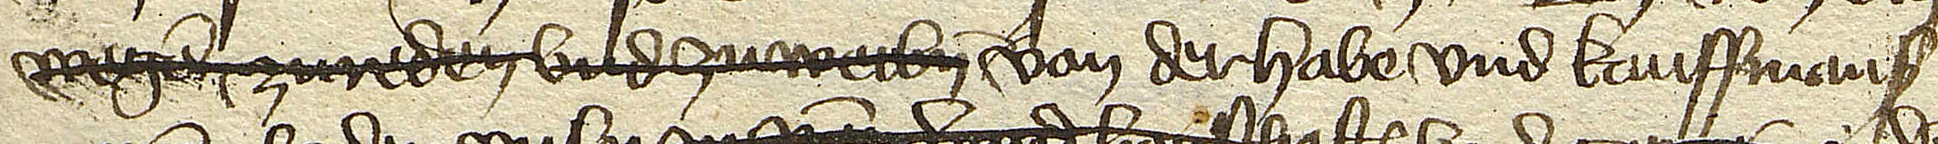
wege* cʒureden vnd cʒuwerbn* von der habe vnd kauffmanſ*
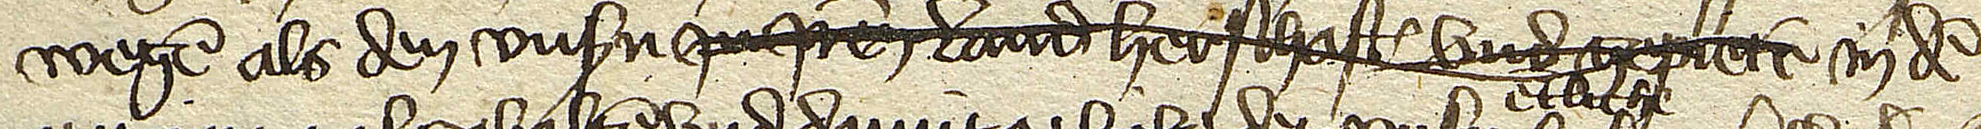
wege* als den vnſ*n In Iren Land herſchaft* vnd gepiete* in d*
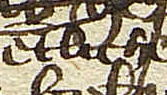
etliche
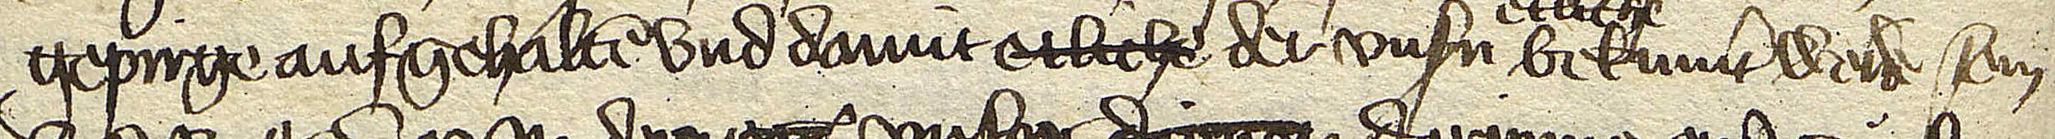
gepirge aufgehalte* vnd damit etliche der vnſ*n bekumt* word* ſein
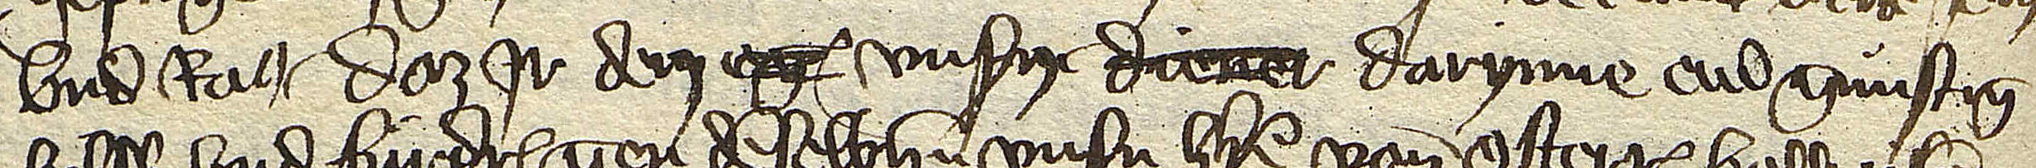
vnd Ro* / daʒ Ir dem eg* vnſ*m diener darynne ew* günſtig
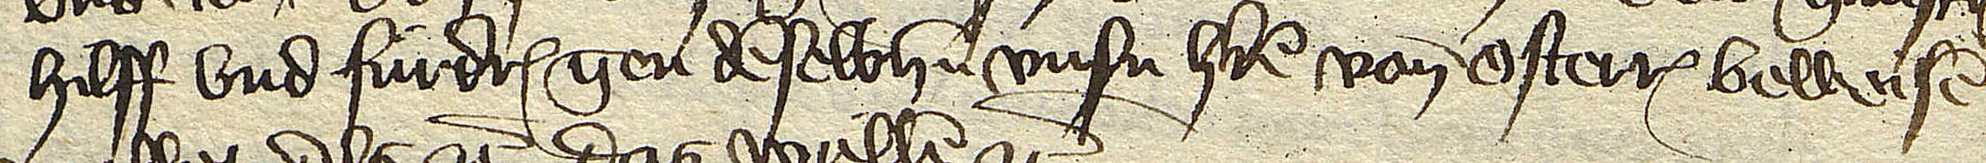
hilff vnd fürdr* gen d*ſelbn* ~ vnſ*n h*re von Oſterr* beweiſe*
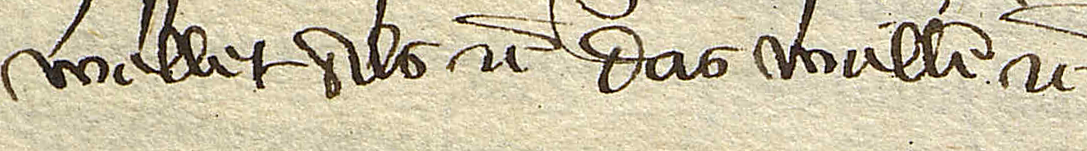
wollet Als ec* das wölle* ec*
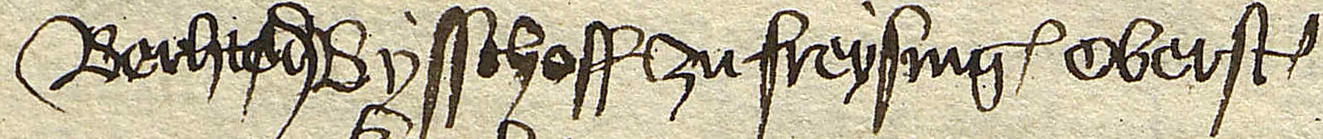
Berhtod Byſſchoff cʒu freyſing* Oberſt*
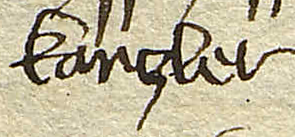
kancʒler
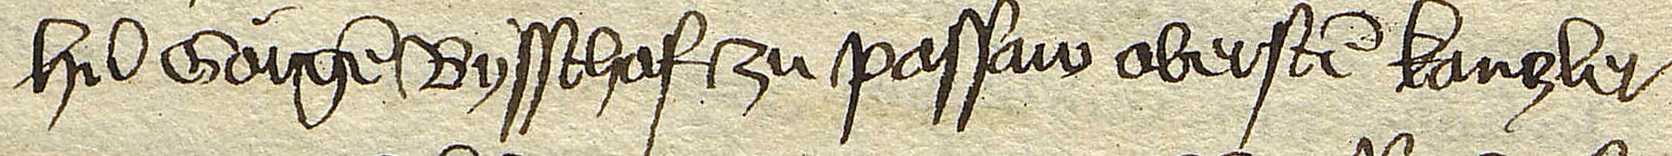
hn* Görge* Byſſchof cʒu paſſaw oberſte* kancʒler
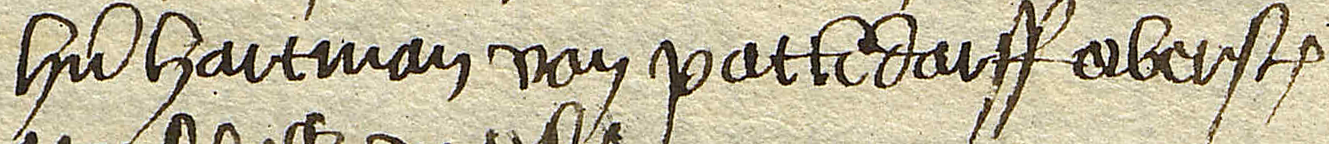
hn* hartman von potte*dorff Oberſt*
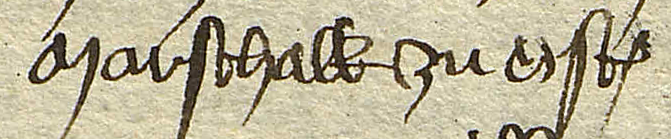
Marſchalk cʒu Oſt*
